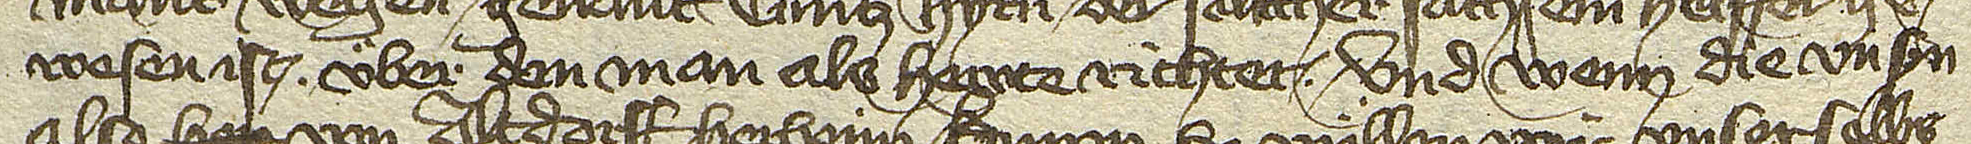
weſen iſt / . v̈ber den man als hewte richtet . / vnd wenn die vnſ*n
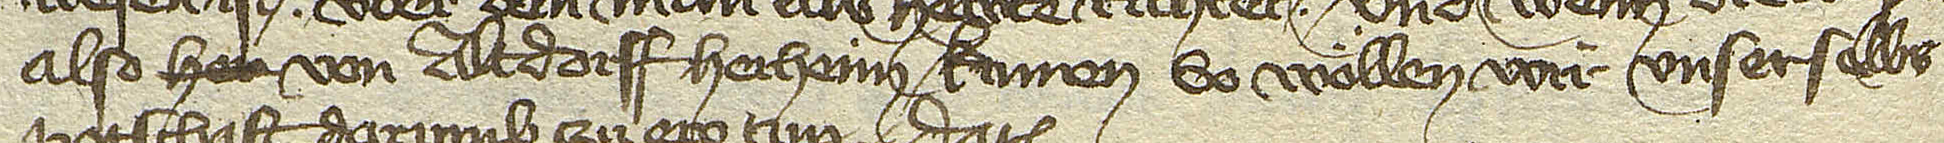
alſo her von Altdorff herheim kumen So wöllen wir vnſerſelbs
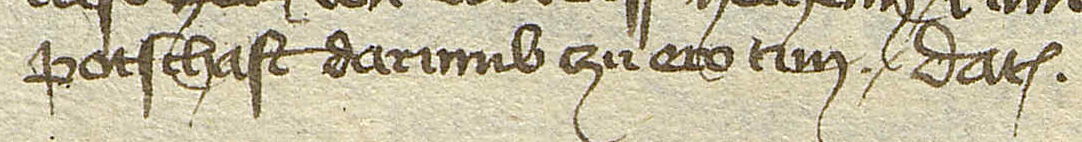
potſchaft darumb cʒu ew tun . / dat* .
